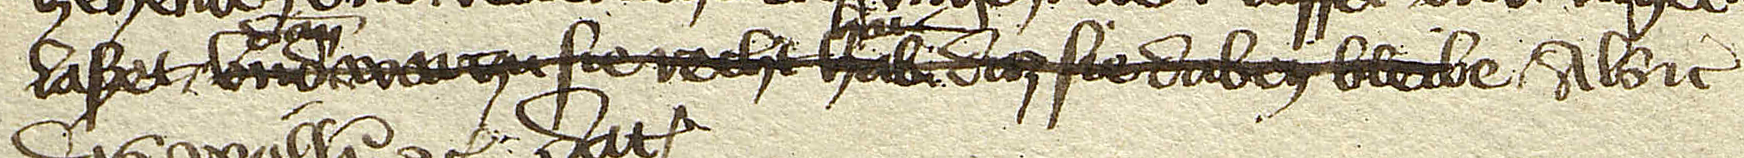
laſʒet / vnd warcʒu ſie recht hab daʒ ſie dabey bleibe / Als ec*
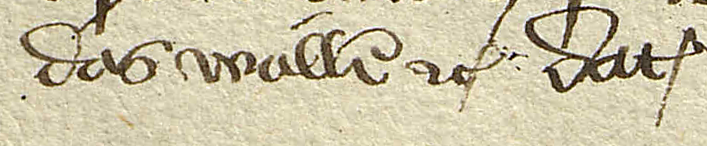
das wölle ec* dat*
